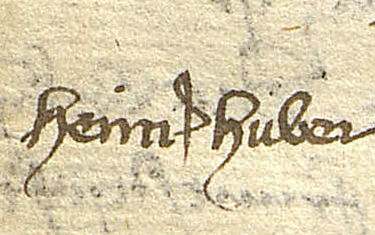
heinr* huber
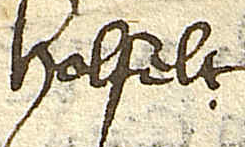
holfelt
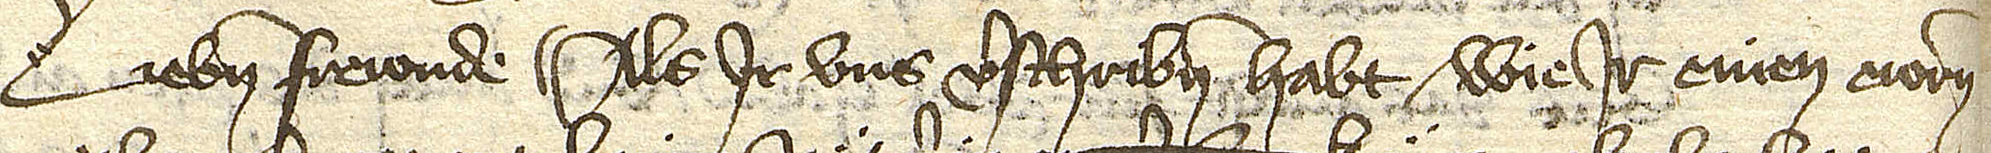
Liebn* frewnde / Als Ir vns v*ſchribn habt / wie Ir einen ewrn*
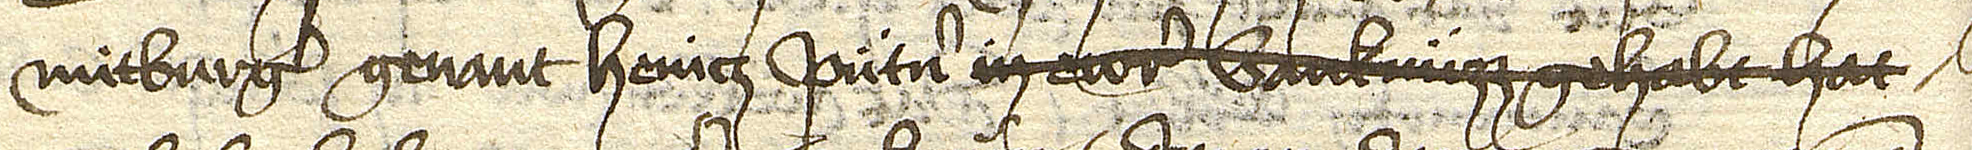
mitburg* genant heincʒ Pütn* in ewr* vanknüʒʒ gehabt hat /
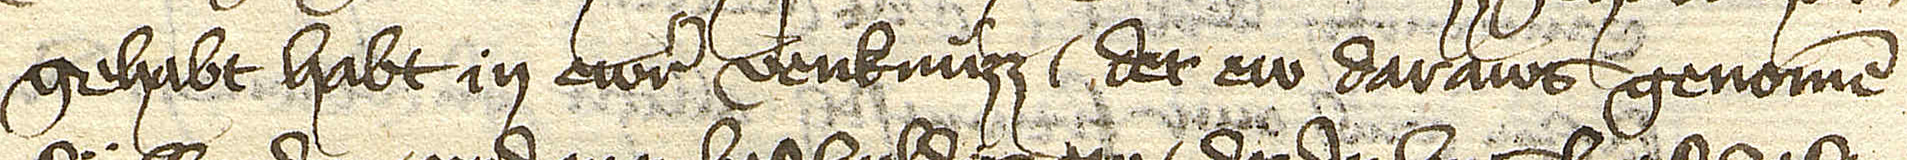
gehabt habt in ewr* venknüʒʒ / der ew daraws genome*
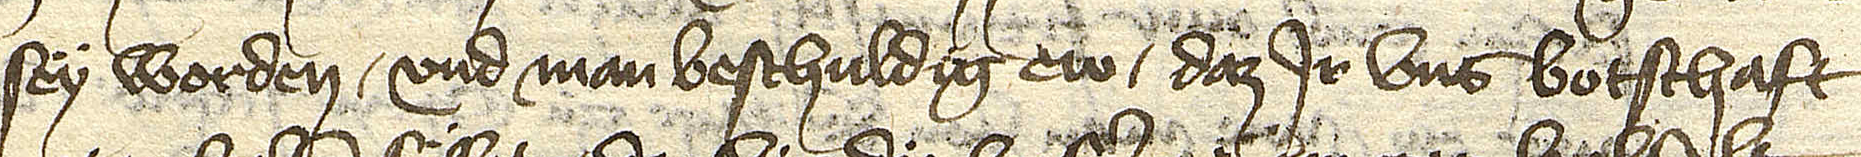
ſey worden / vnd man beſchuldig ew / daʒ Ir vns botſchaft
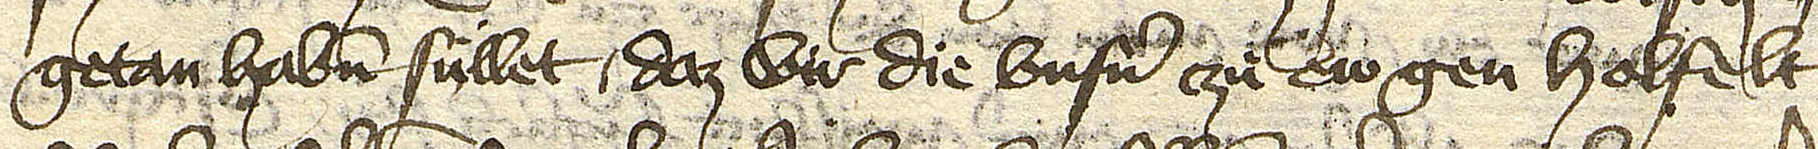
getan habn* ſüllet / daʒ wir die vnſn* cʒü ew gen holfelt
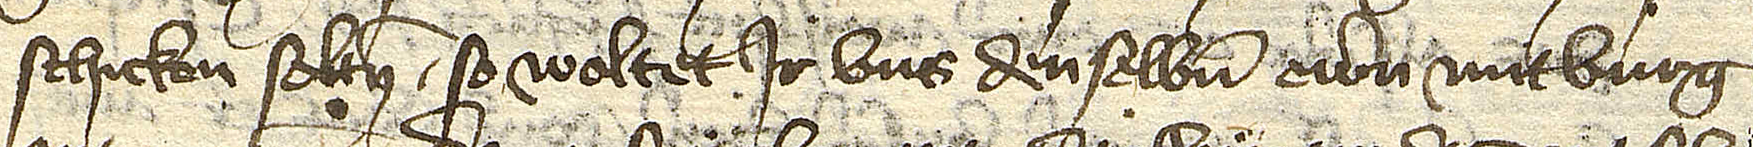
ſchicken ſoltn* / ſo woltet Ir vns denſelbn* ewn* mitburg*
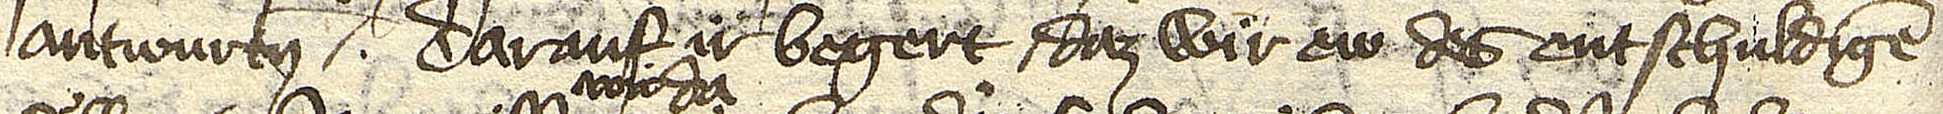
antwurtn* / . Darauf ir begert / daʒ wir ew des entſchuldige*
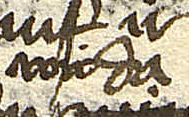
wir da
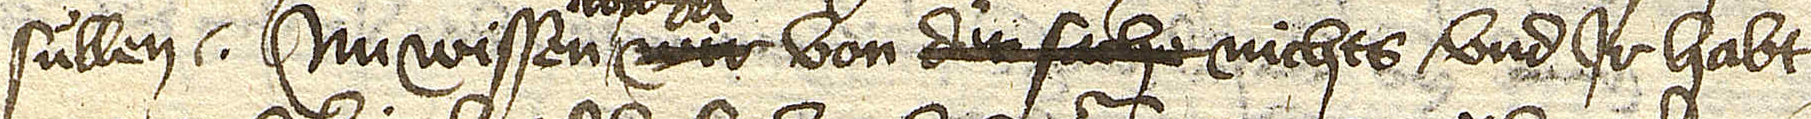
ſüllen / . Nu wiſſen wir von die ſache nichts / vnd Ir habt
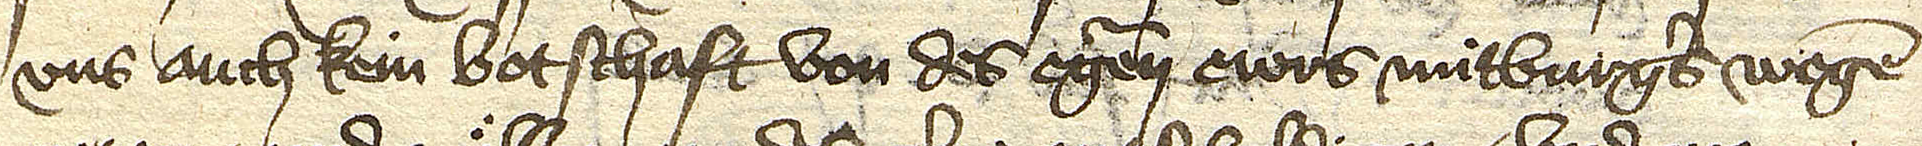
vns auch kein botſchaft von des egen* ewrs mitburg*s wege*
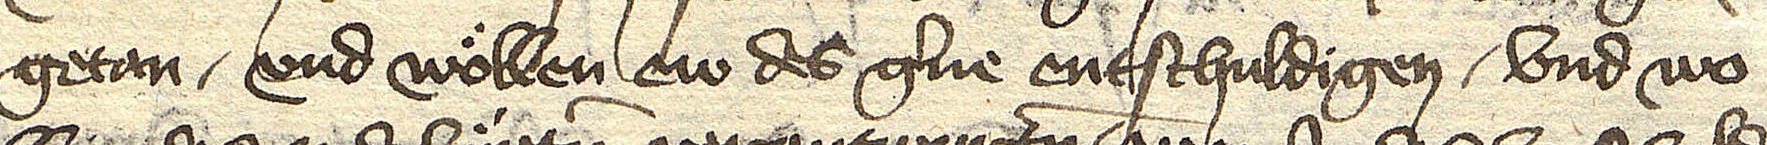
getan / vnd wöllen ew des g*ne entſchuldigen / vnd wo
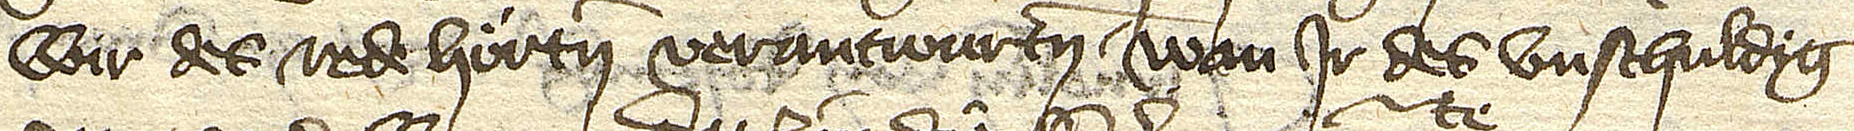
wir des red hörtn* verantwurtn* / wan Ir des vnſchuldig
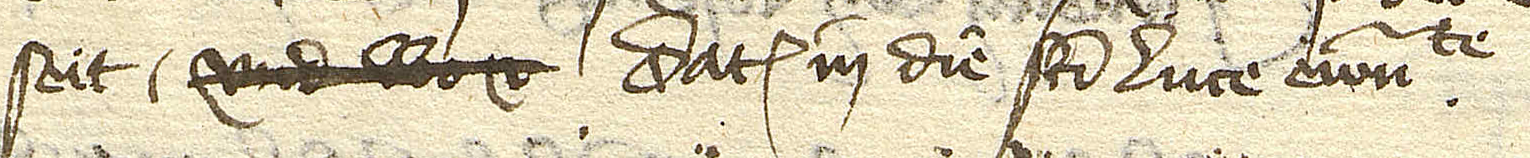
ſeit / vnd wo % / Dat* in die ſci* Luce ewn* .
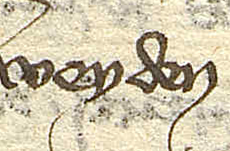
Weyden
